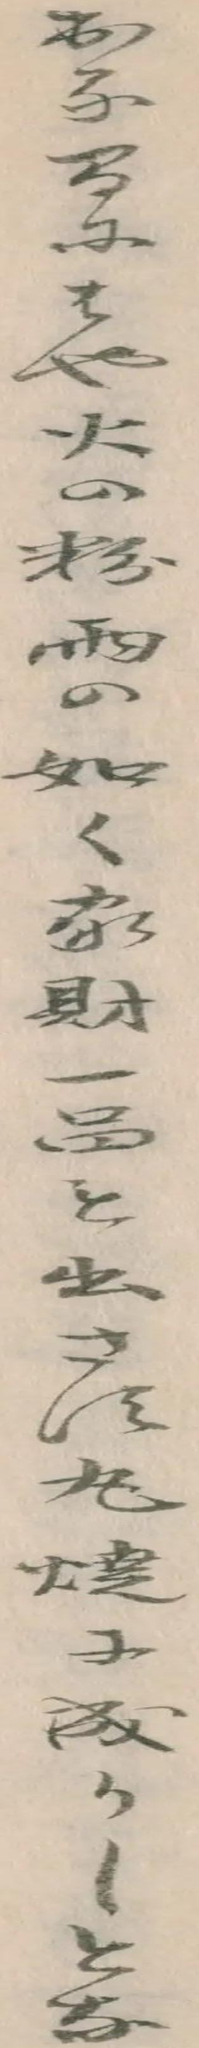出る間にはや火の粉雨の如く家財一品も出さす丸焼に成りしとな
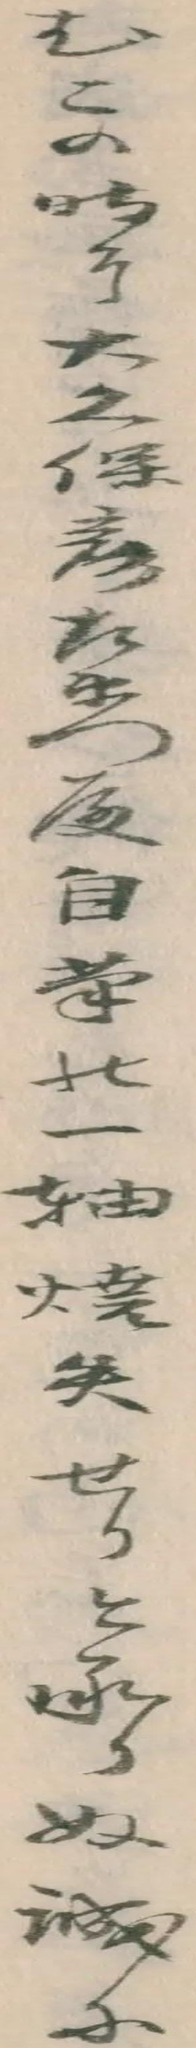むこの時に大久保彦左衛門殿自筆の一軸焼失せりと承りぬ誠に
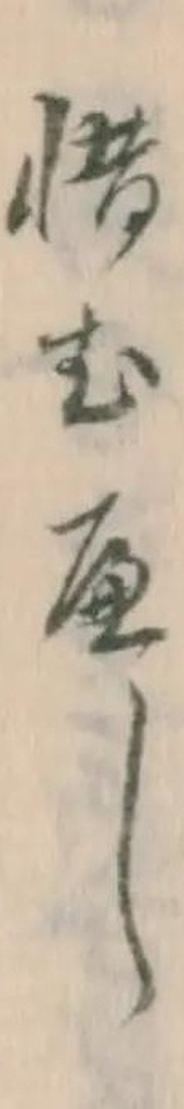惜むへし
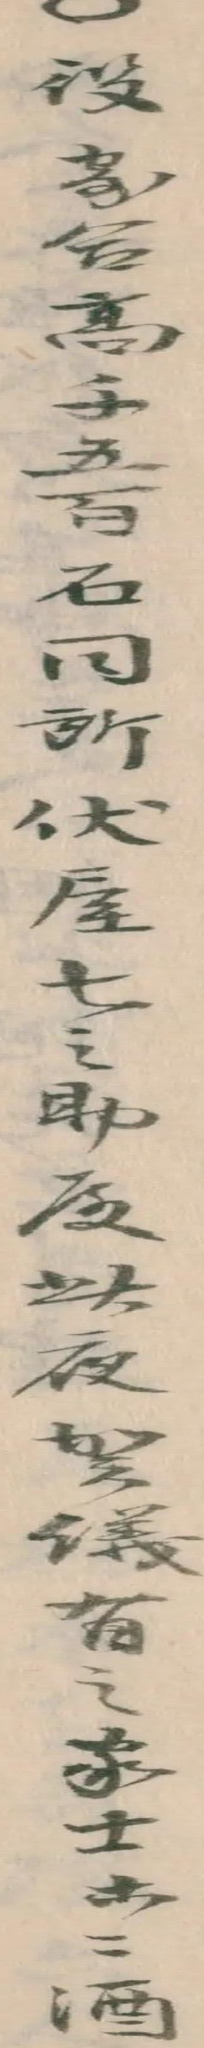〇役寄合高千五百石同所伏屋七之助殿此夜賀儀有之家士等に酒
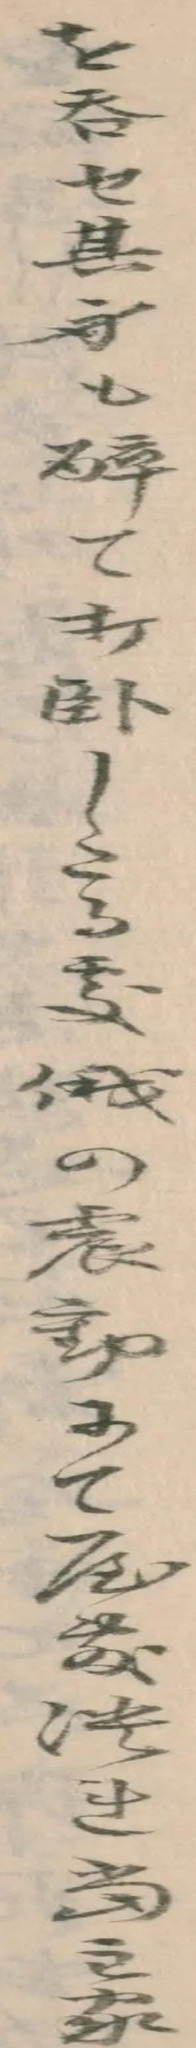を呑せ其身も砕て打臥したる処俄の震動にて屋敷潰れ当主家
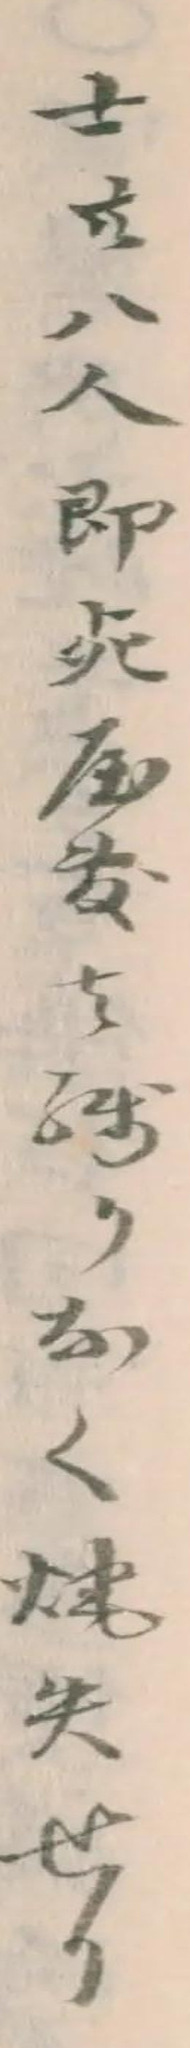士共八人即死屋敷は残りなく焼失せり
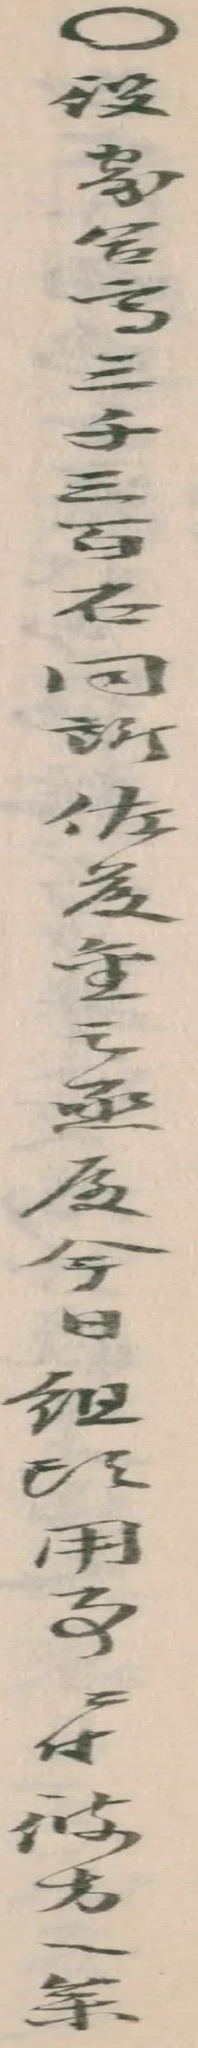〇役寄合高三千三百石同所佐藤重之丞殿今日組頭用事付彼方へ参
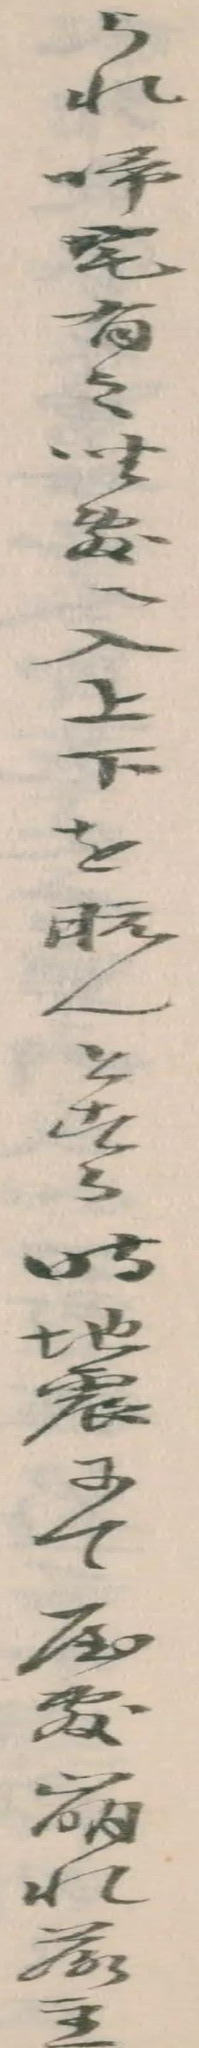られ帰宅有之坐敷へ入上下を脱んとする時地震にて屋敷崩れ落主
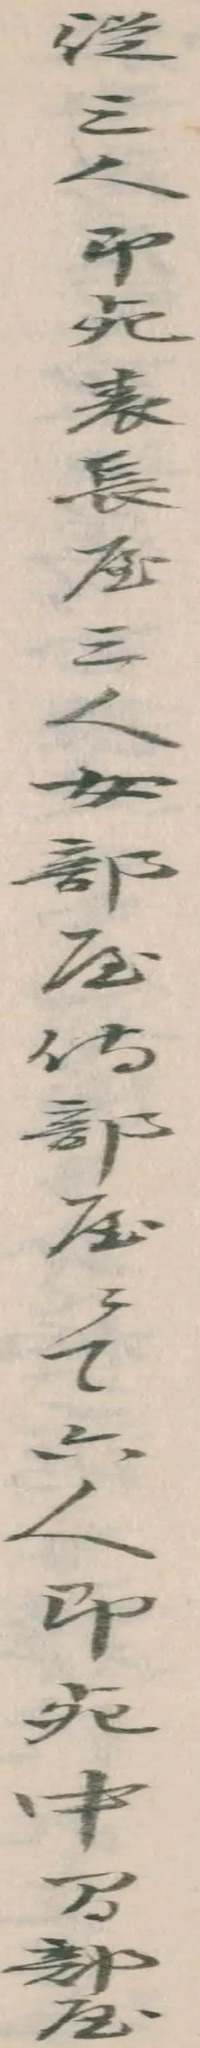従三人即死表長屋三人女部屋侍部屋にて六人即死中間部屋
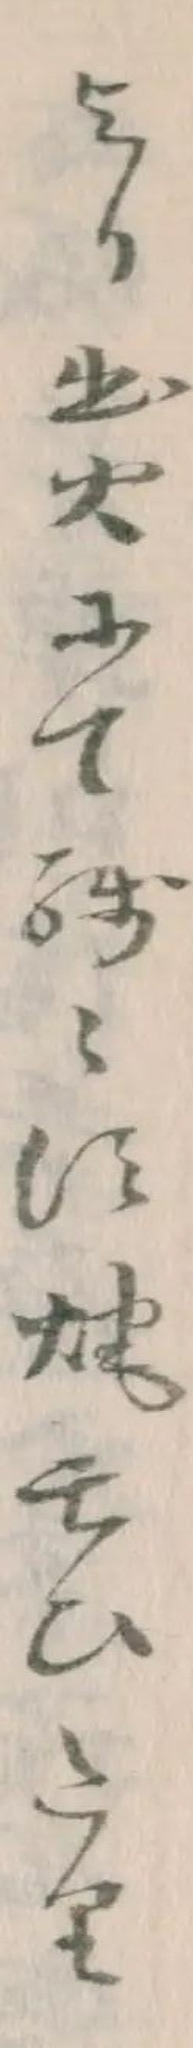より出火にて残らす焼亡ひたり
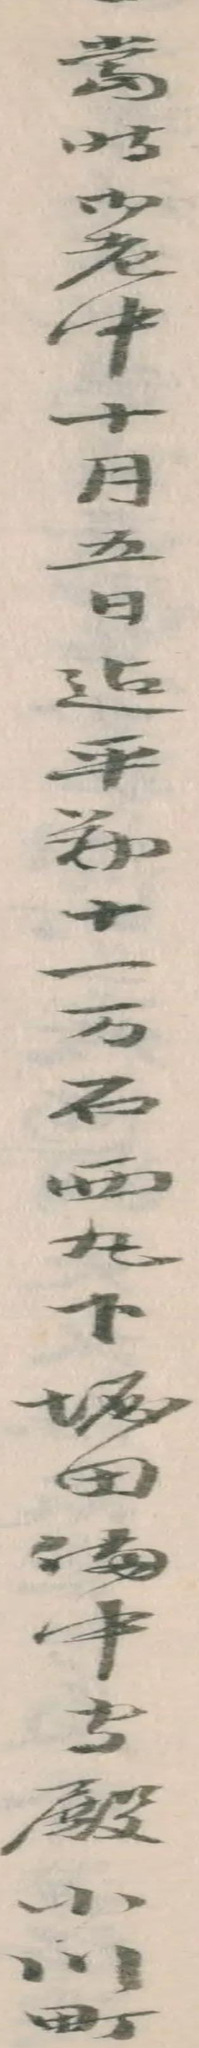〇当時御老中十月五日迄平勤十一万石西丸下堀田備中守殿小川町
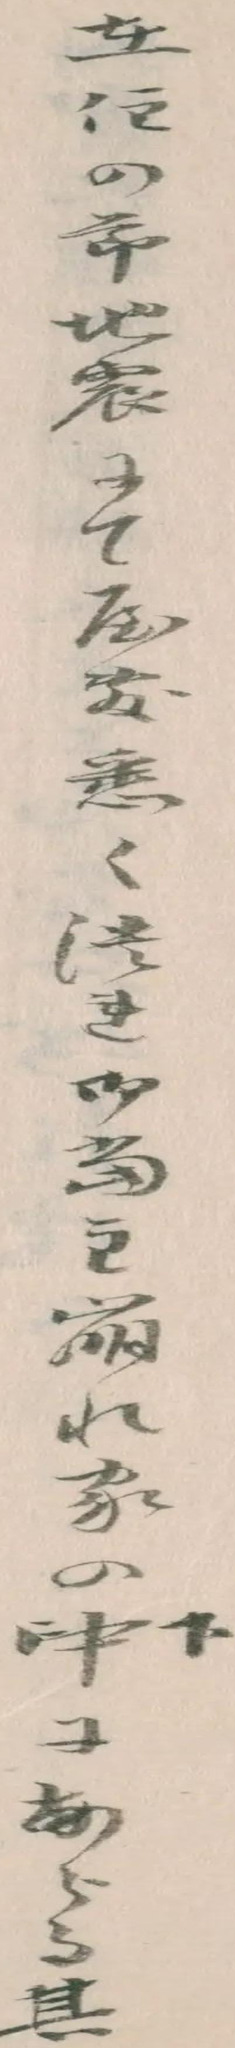在住の節地震にて屋敷悉く潰れ御当主崩れ家の中にあらる其
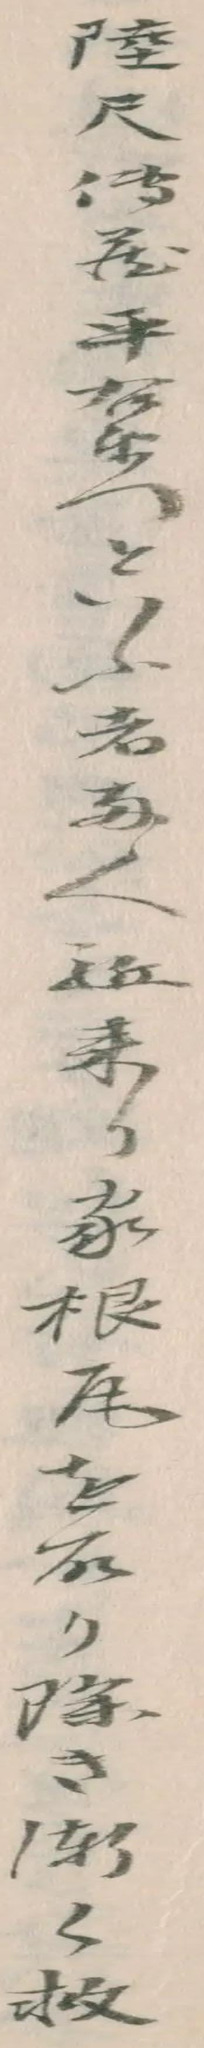陸尺伝蔵平右衛門といふ者両人駈来り家根瓦を取り除き漸く救
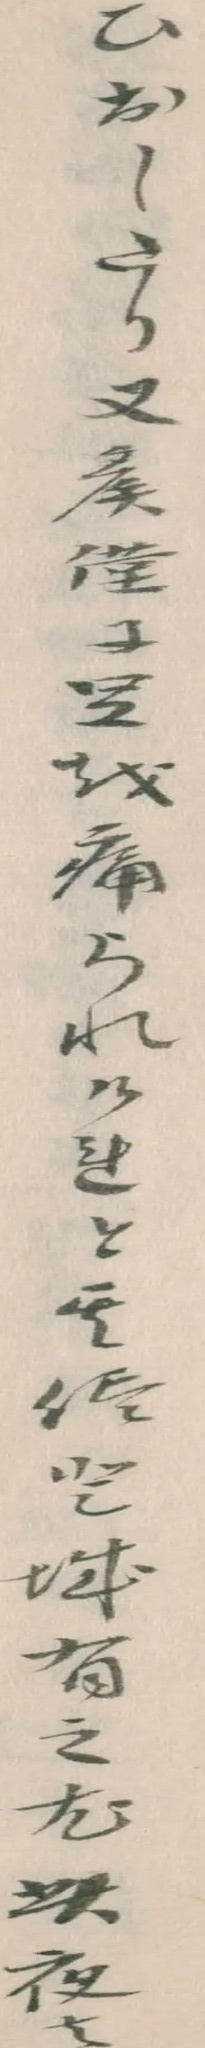ひ出したり又侯僅に足を痛られけれと其侭登城有之尤此夜は
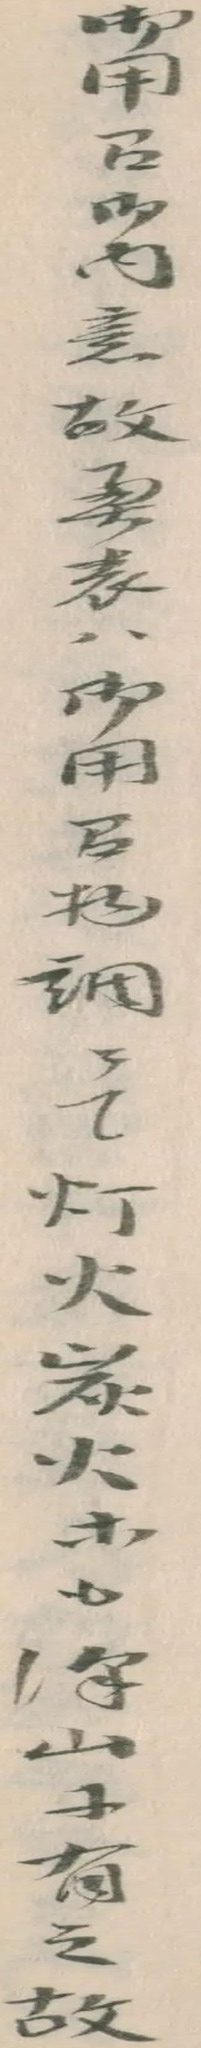御用召御内意故奥表は御用召物調にて灯火炭火等も沢山に有之故

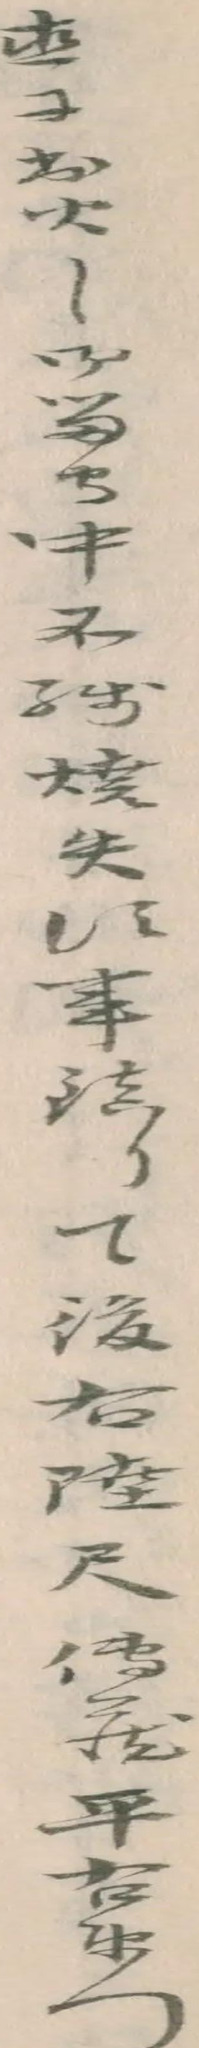直に出火し御留守中不残焼失す事鎮りて後右陸尺伝蔵平右衛門
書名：地災撮要. 巻10(地震之部) 上,下
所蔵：国立国会図書館 National Diet Library, JAPAN
